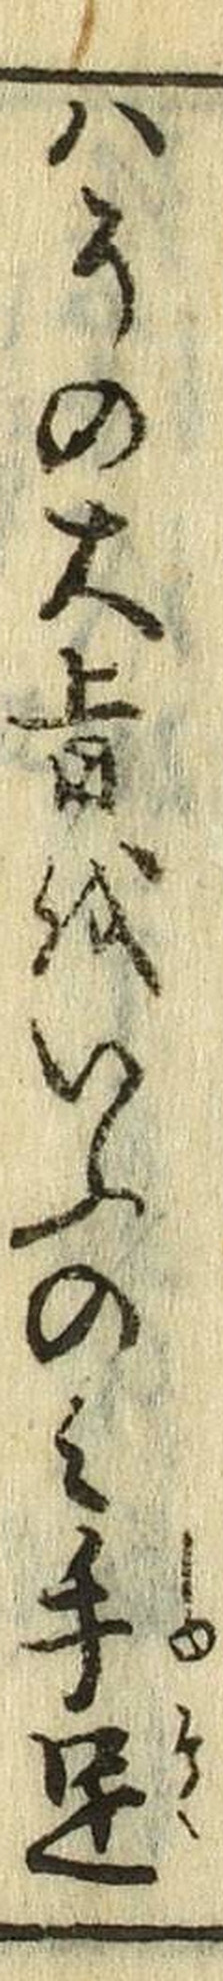はその大旨をいふのみ手足
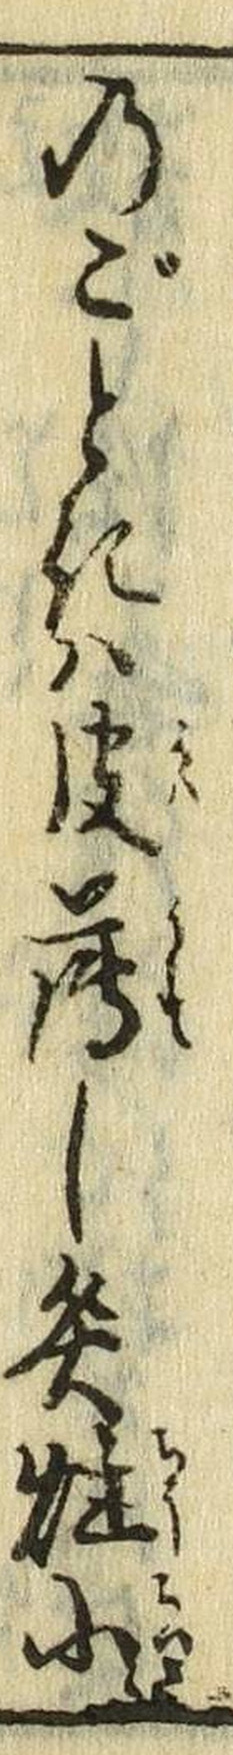のごときは皮薄し灸炷小
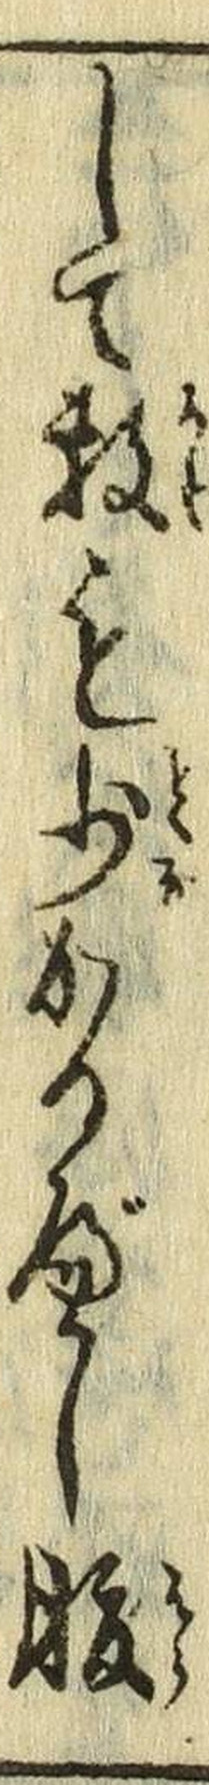して数も少かるべし腹
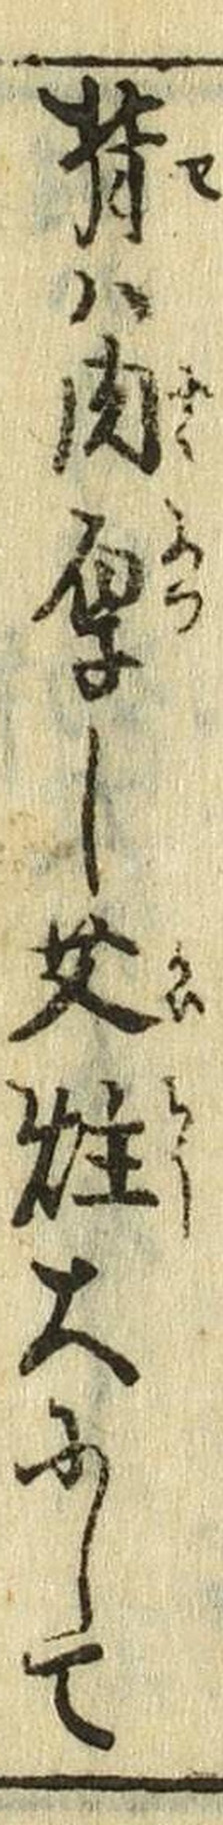背は肉厚し艾炷大にして
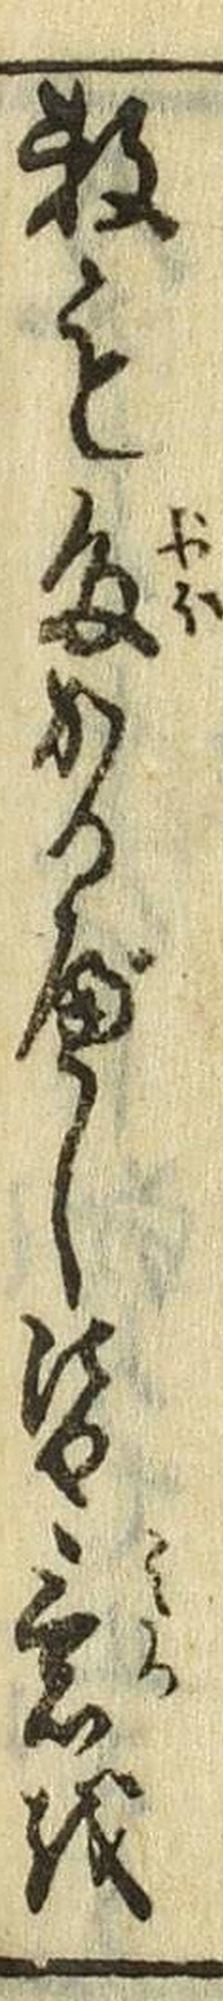数も多かるべし皆意を
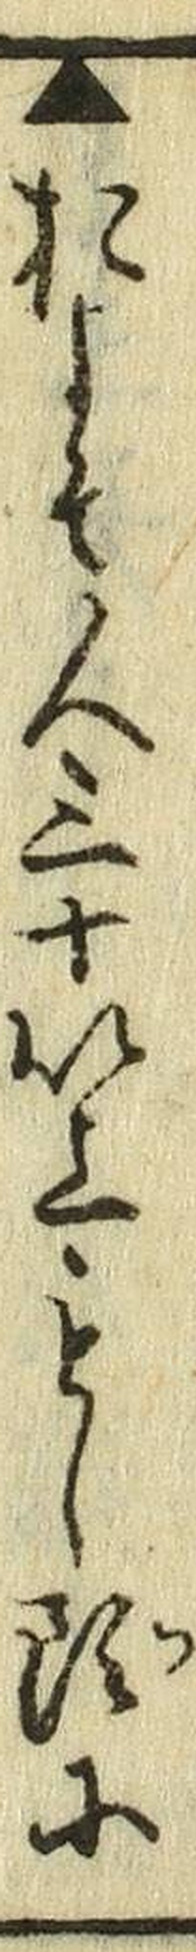▲およそ人三十以上もし頭に
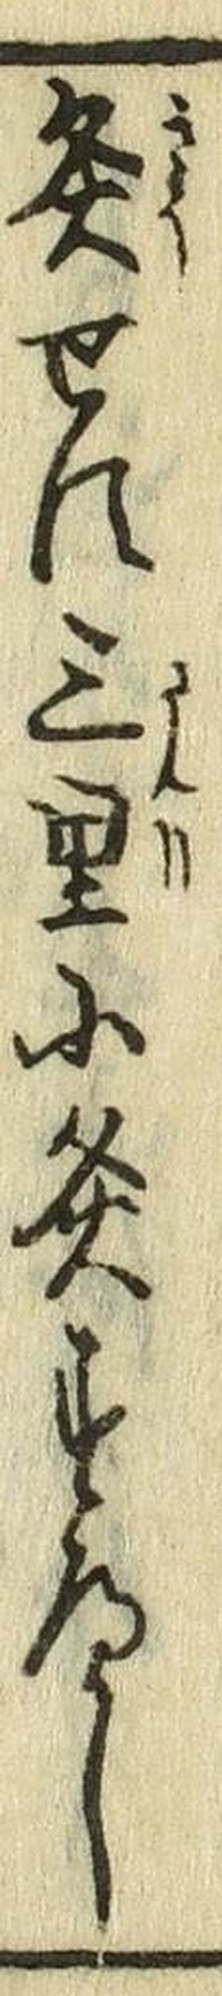灸せす三里に灸すへし
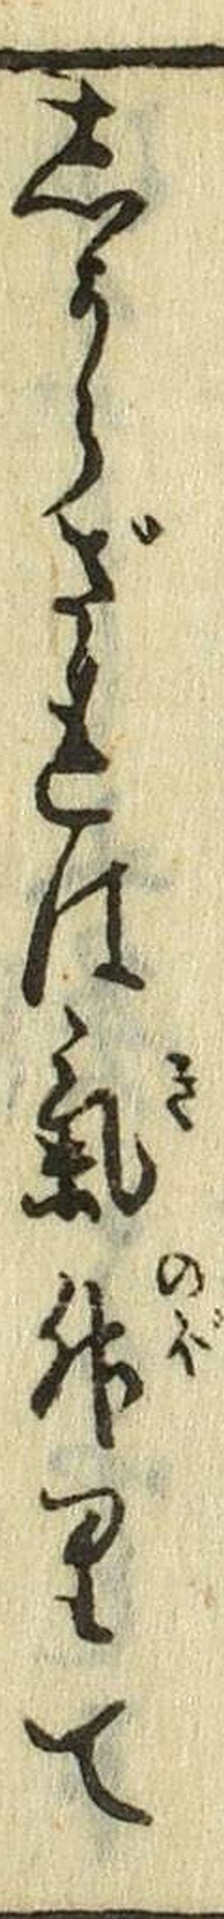しからざれは気升りて
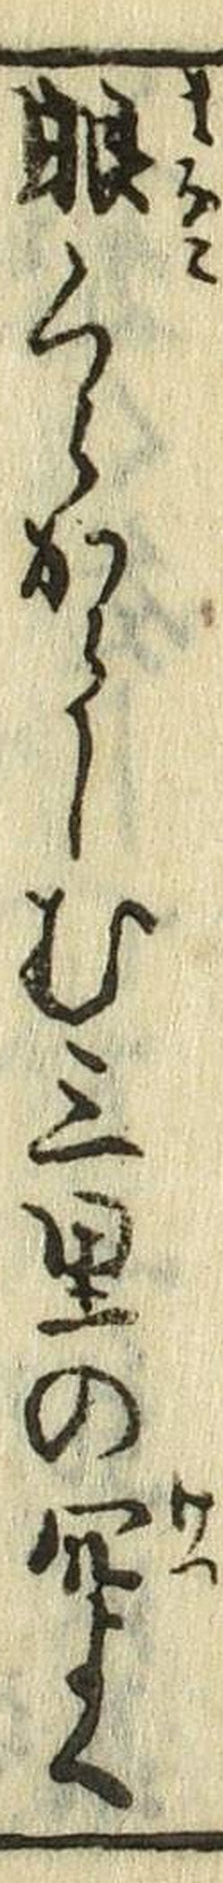眼くらからしむ三里の穴よく
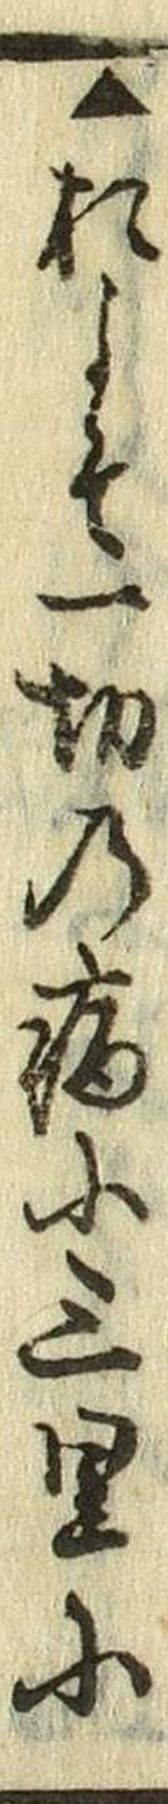▲およそ一切の病に三里に
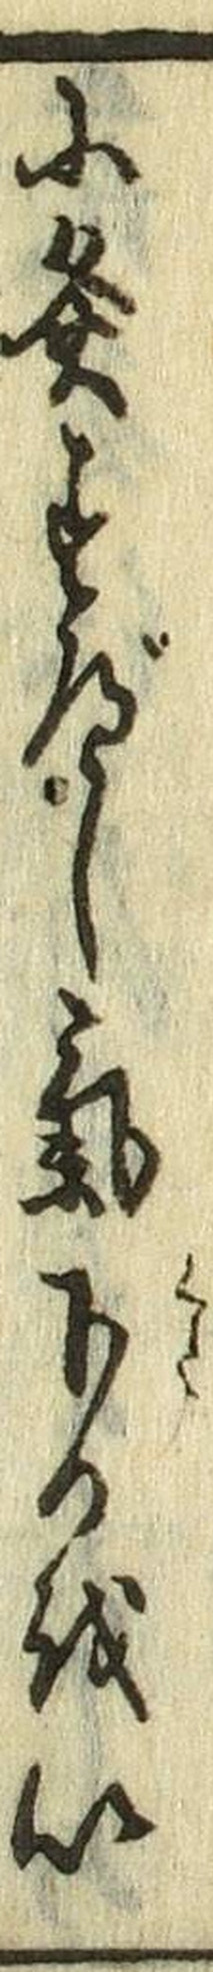に灸すべし気下るを以

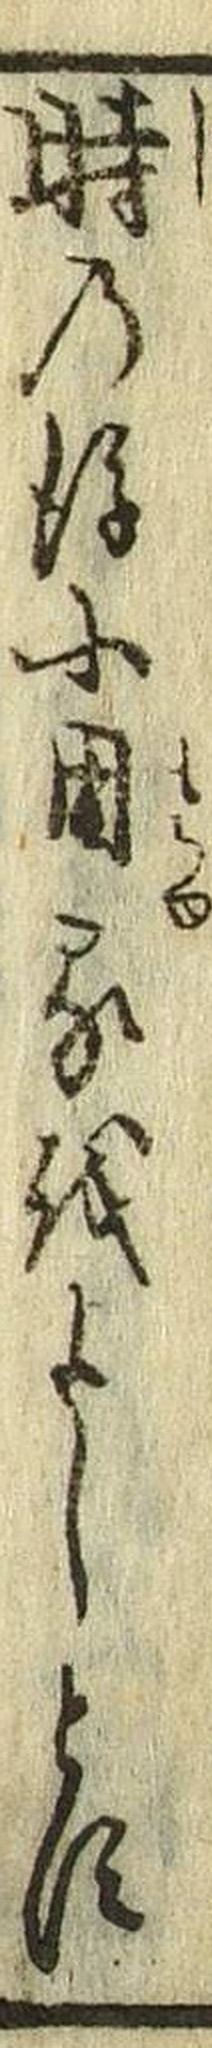時の後に用るをよしとす
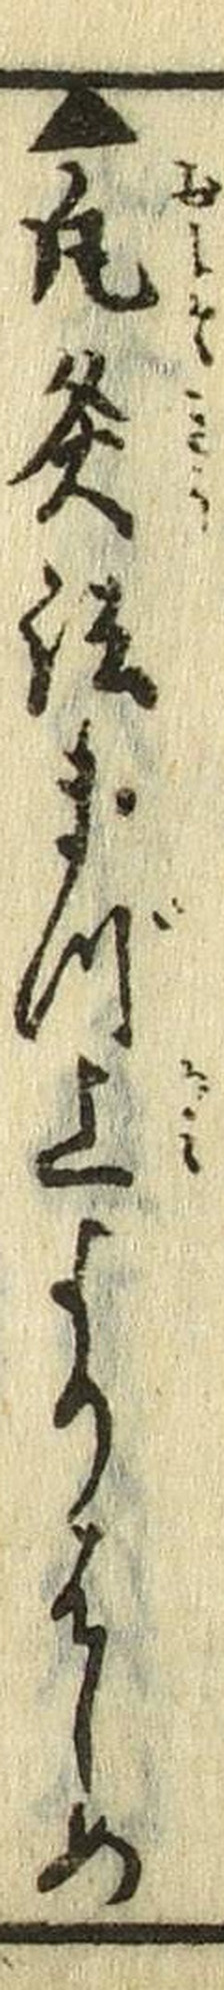▲凡灸法まづ上よりはしめ
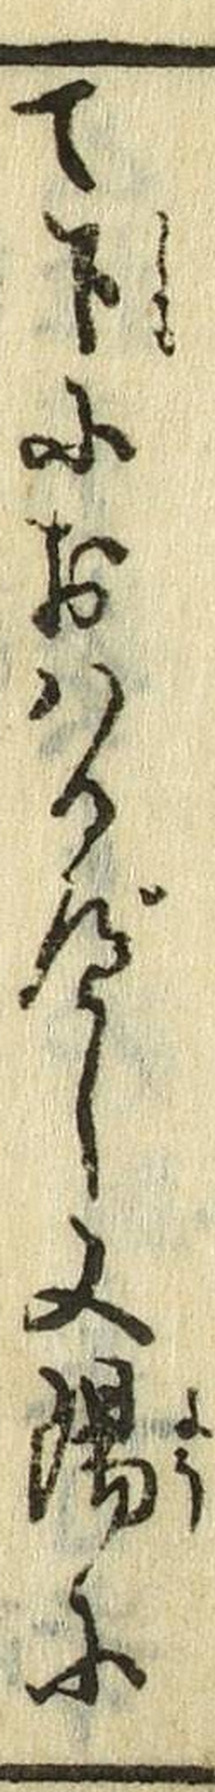て下におはるべし又陽に
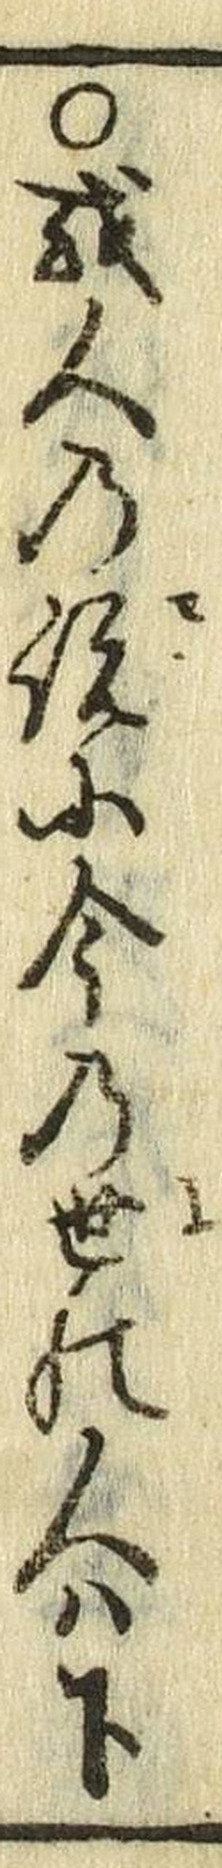○或人の説に今の世の人は下
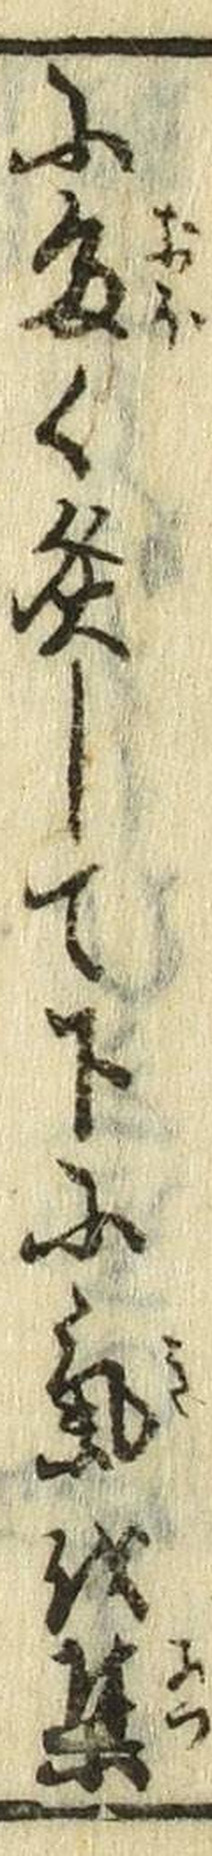に多く灸して下に気を集
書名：居家養生記
